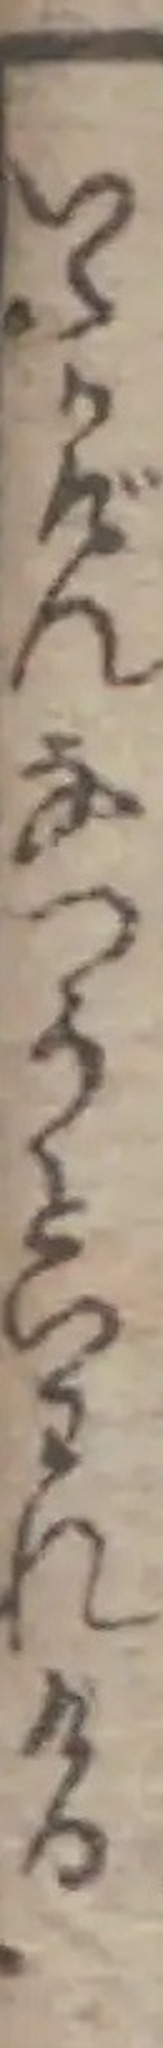いゝかげんなつうといわれける
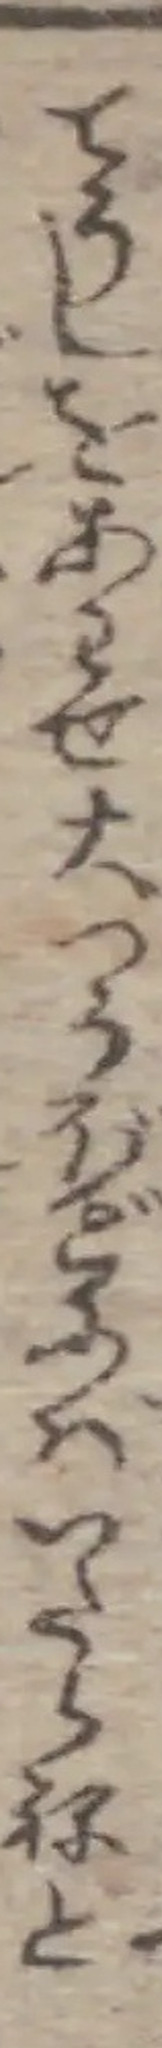てうしをあわせ大つうほどにはいたらねと
